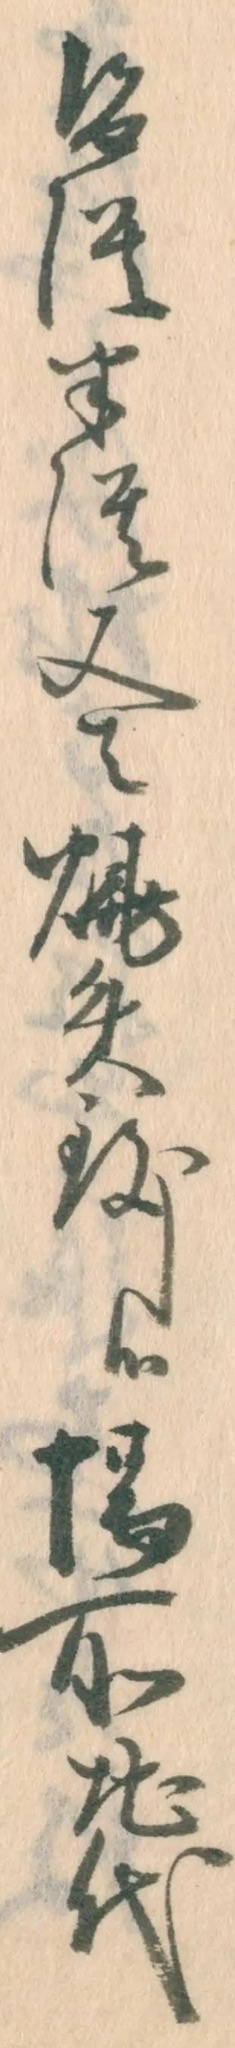皆潰半潰又は焼失致し候場所地代

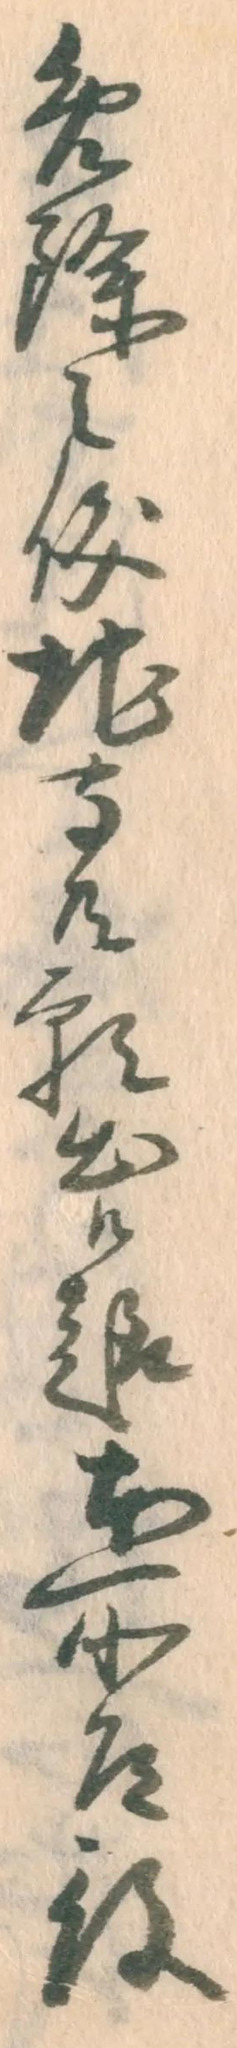免除之儀地守共願出候趣本所道役
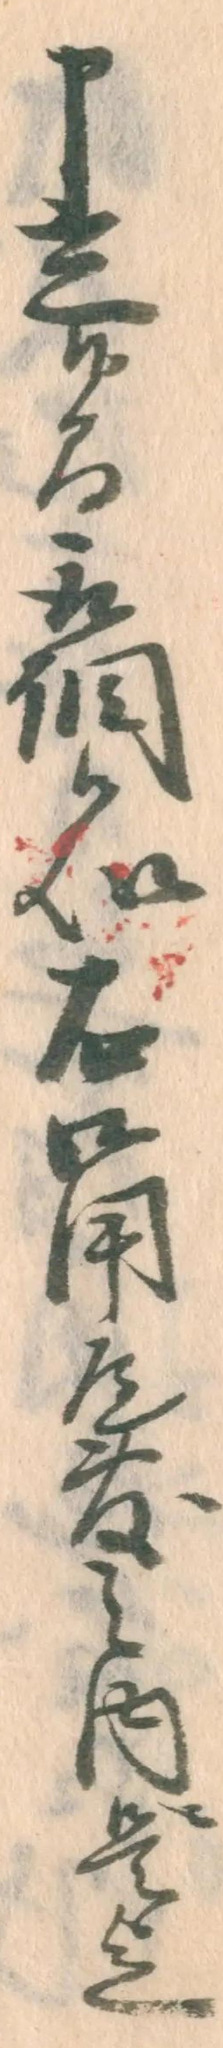申立候間取調候処右御用屋敷之内に是迄
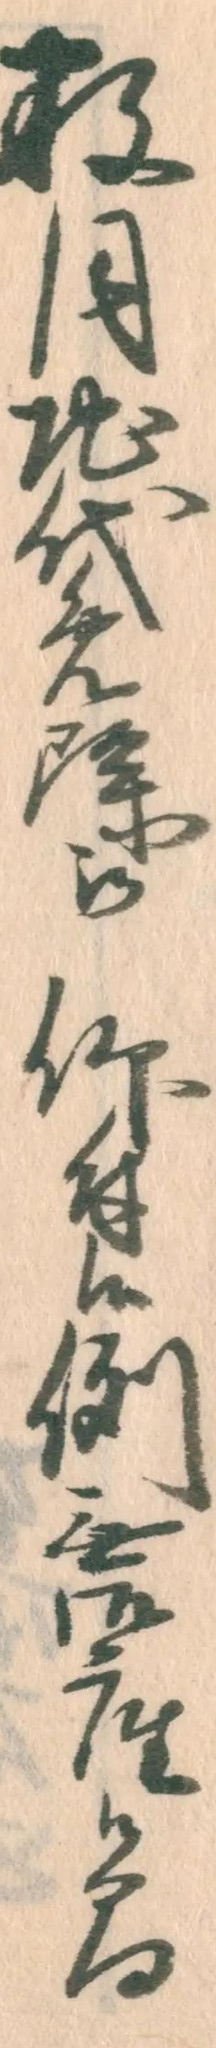数月地代免除被仰付例無御座候間
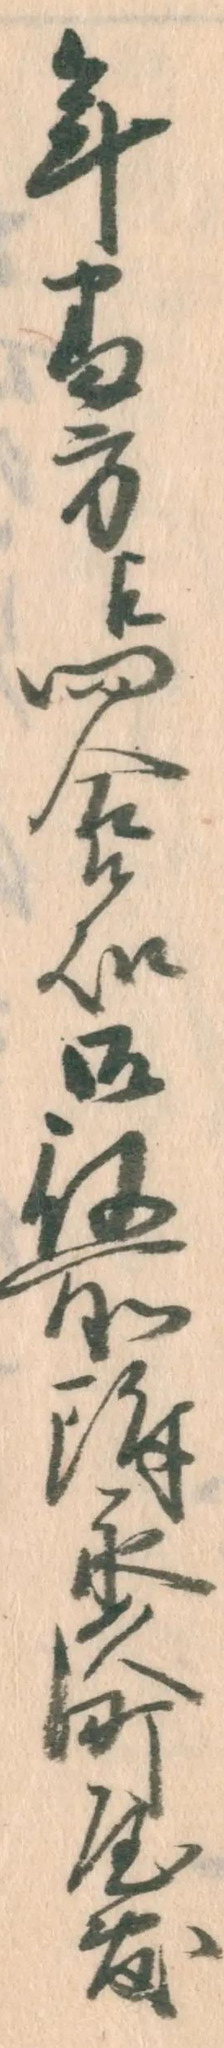年番方え問合候処御役所附永久町屋敷
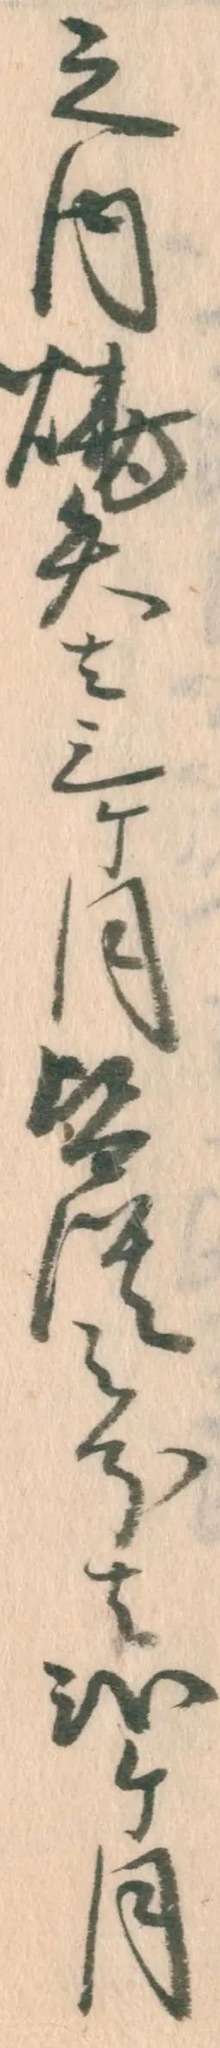之内焼失は三ヶ月皆潰之分は弐ヶ月
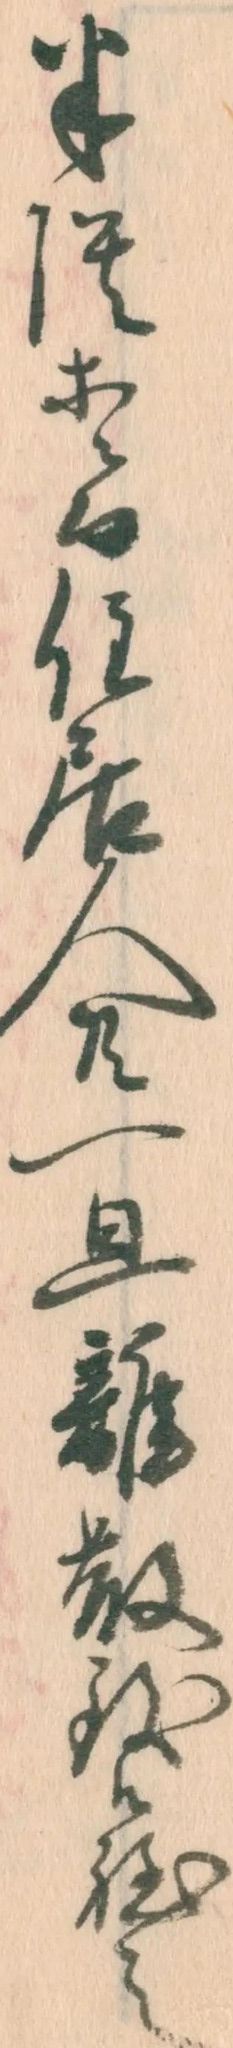半潰等に而住居人共一旦離散致候程之
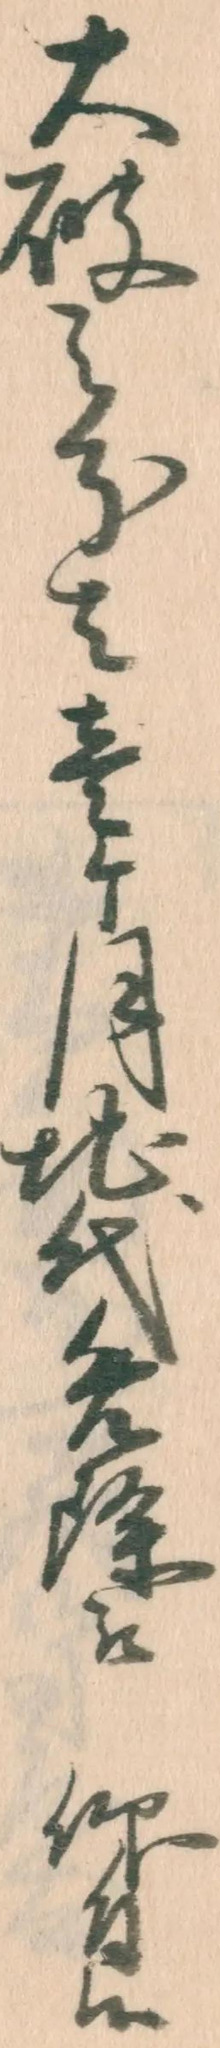大破之分は壱ヶ月地代免除被仰付候
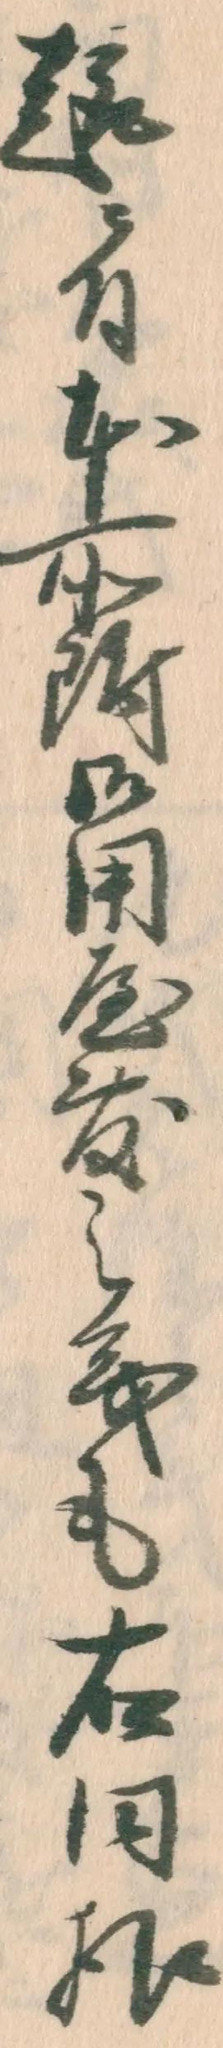趣に付本所附御用屋敷之義も右同様
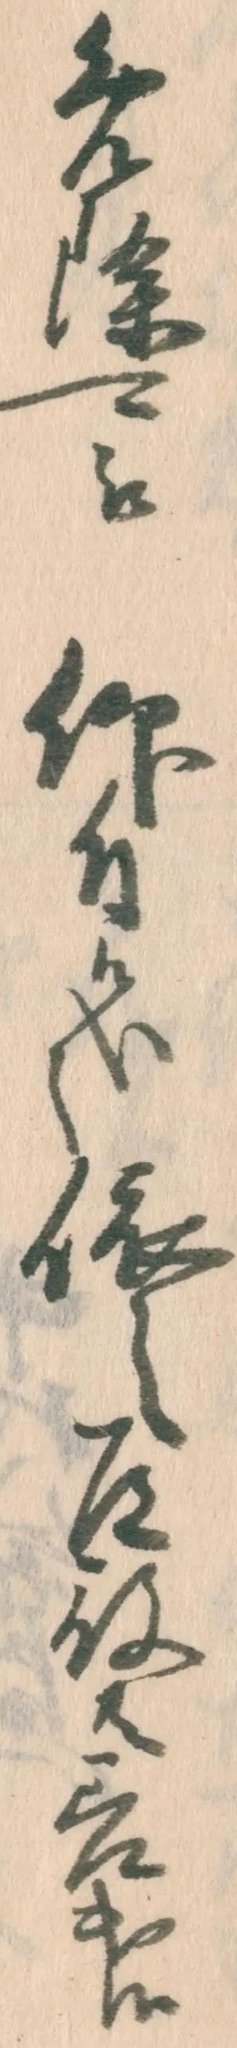免除可被仰付候哉依之道役共差出候
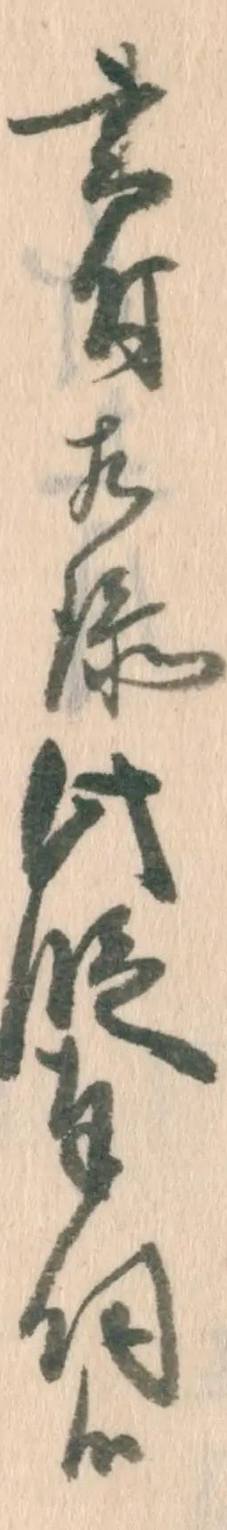書付相添此段奉伺候

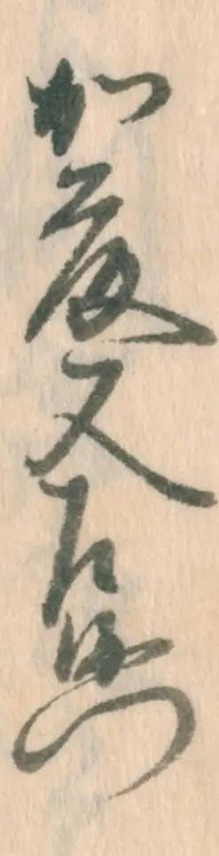卯十二月加藤又左衛門
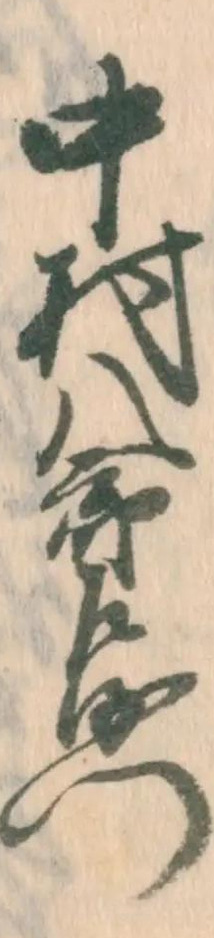中村八郎左衛門
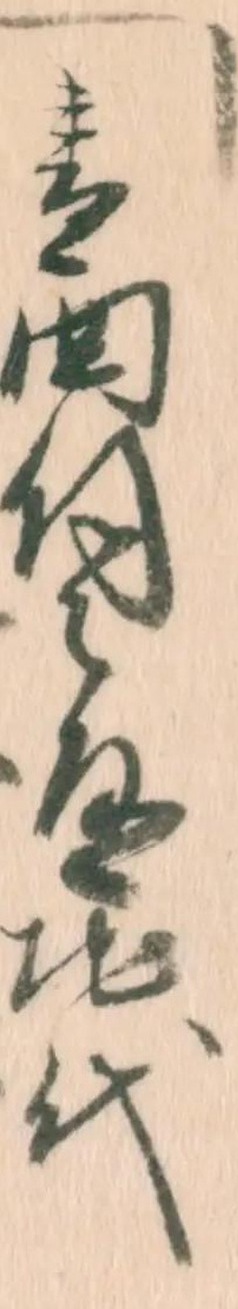書面伺之通地代
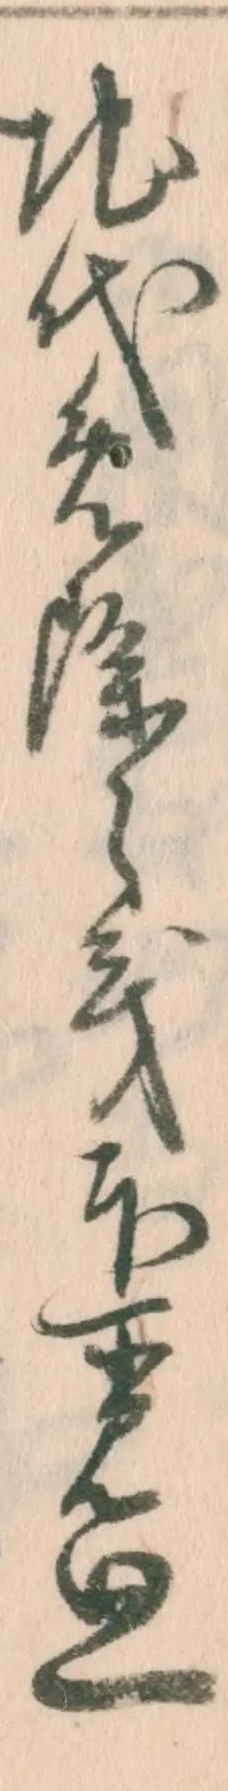地代免除之義本所見廻
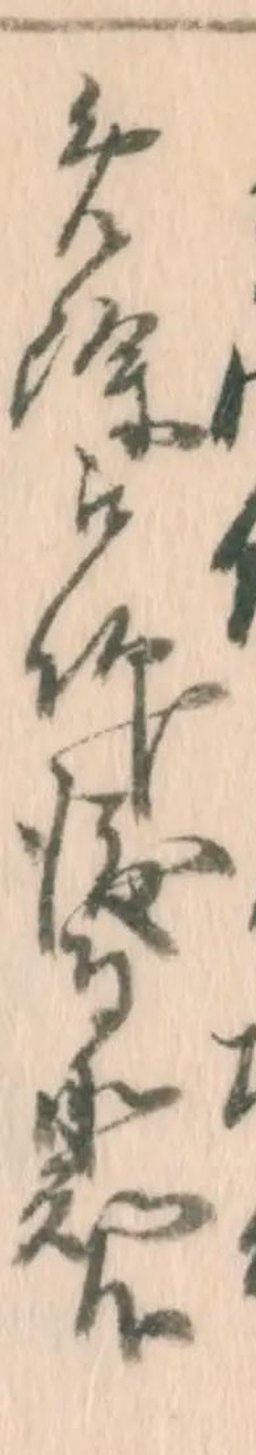免除被仰渡付承知候
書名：地震災書留 2巻. [1] 内表紙に「地震災書留　安政二卯年　但本所深川御用屋敷地代免除調」とあり
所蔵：国立国会図書館 National Diet Library, JAPAN
